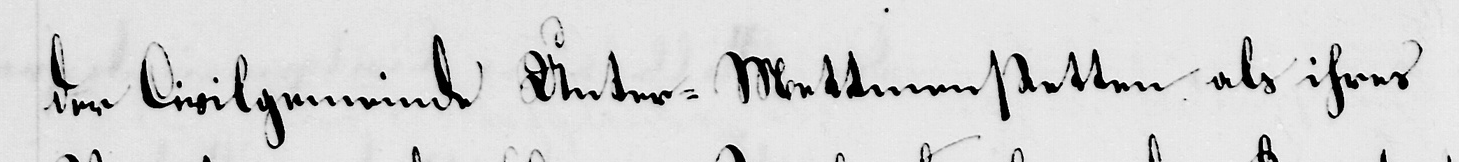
der Civilgemeinde Unter-Mettmenstetten als ihres
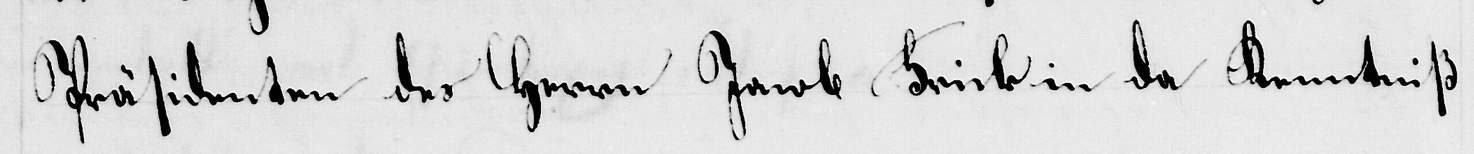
Präsidenten des Herrn Jacob Frick in da Kenntniß
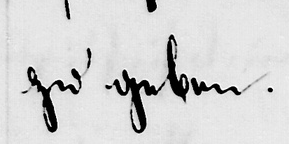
zu geben.
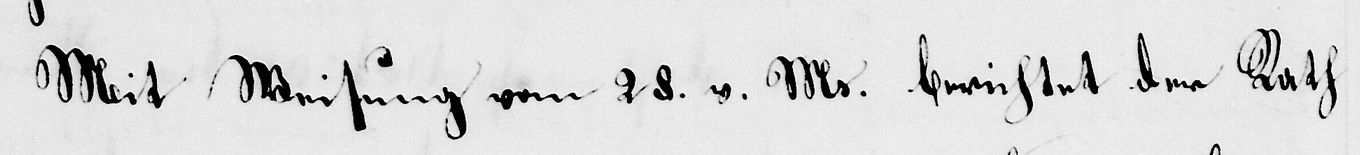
Mit Weisung vom 28. v. Ms. berichtet der Rath
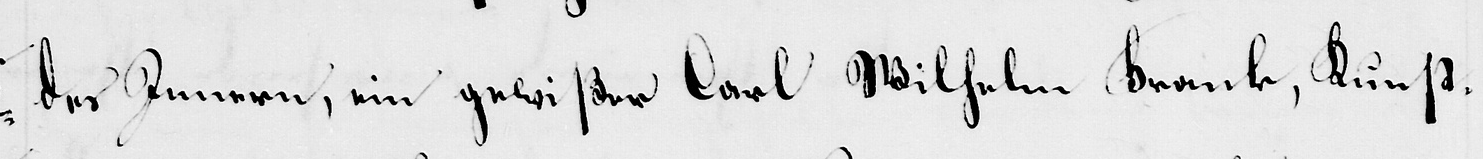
des Innern, ein gewißer Carl Wilhelm Frank, Kunst¬
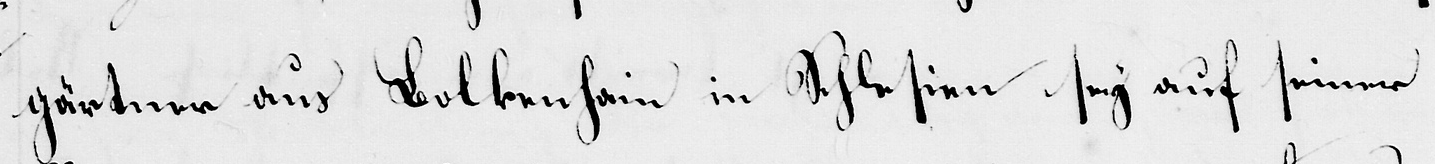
gärtner aus Bolkenhain in Schlesien sey auf seiner
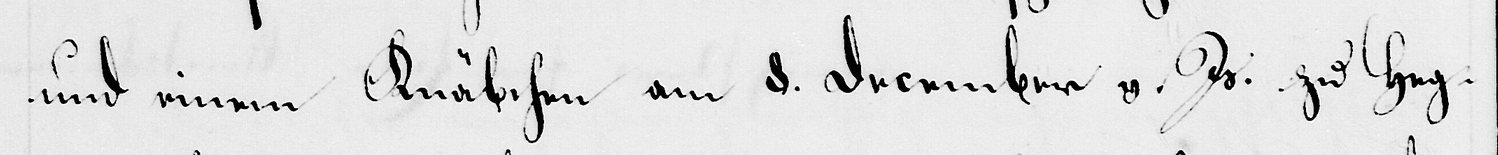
und einem Knäbchen am 8. December v. Js. zu Heg¬
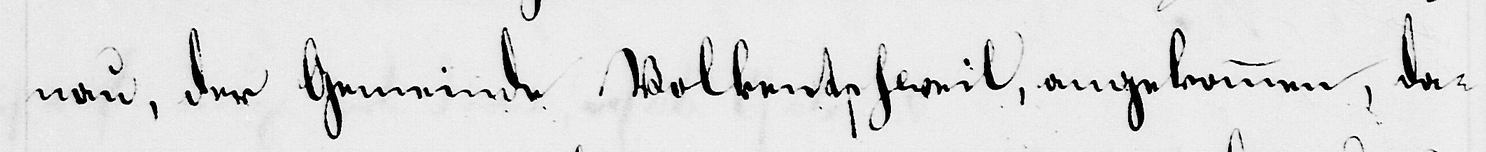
nau, der Gemeinde Volkentschweil, angekommen, da¬
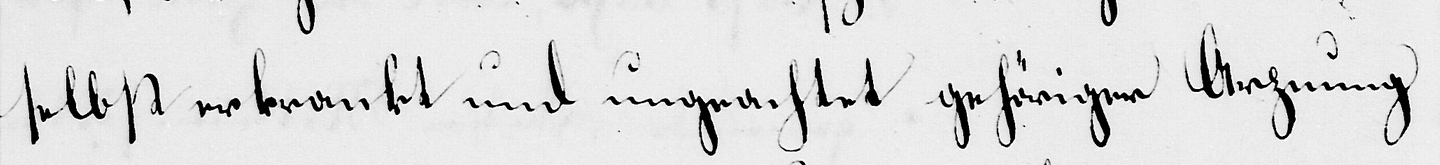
selbst erkrankt und ungeachtet gehöriger Arznung
